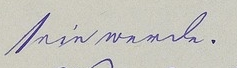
sein werde.
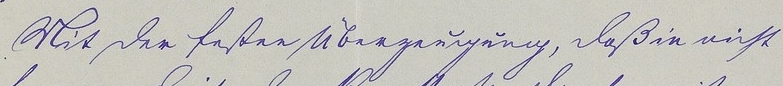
Mit der festen Überzeugung, daß in nicht
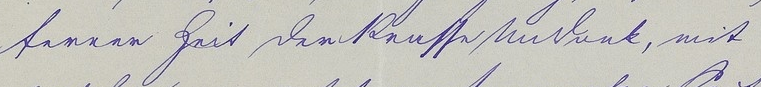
ferner Zeit der krasse Undank, mit
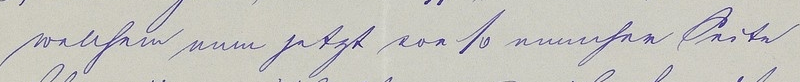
welchem man jetzt von so mancher Seite
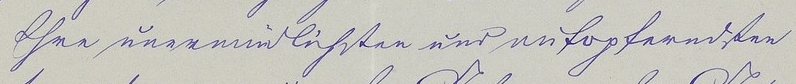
Ihre unermüdlichsten und aufopferndsten
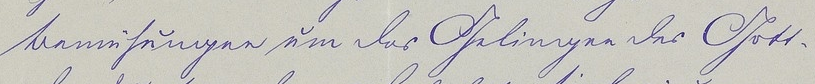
Bemühungen um das Gelingen des Gott-
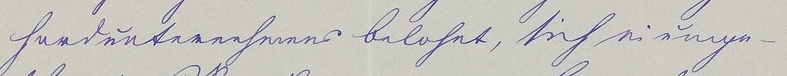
hardunternehmens belohnt, sich in unge-
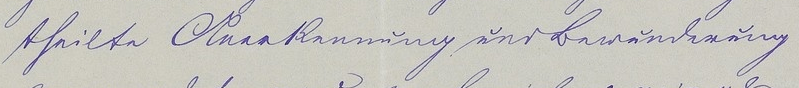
theilte Annerkennung und Bewunderung
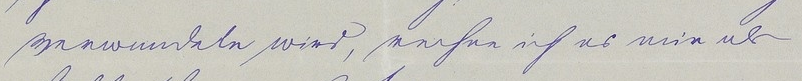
verwandeln wird, rechne ich es mir als
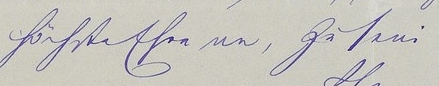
höchste Ehre an, zu sein
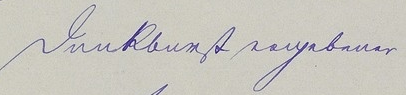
dankbarst ergebener
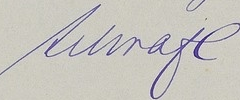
Schrafl
